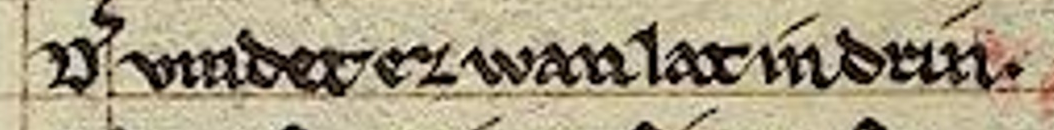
D(er) vindet ez wan lat in drin.
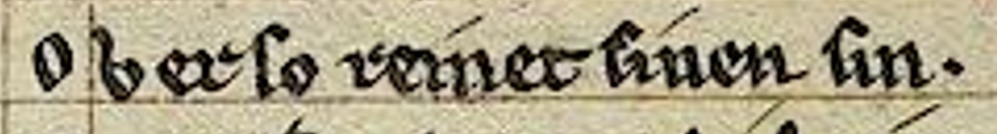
Ob er ſo reinet ſinen ſin.
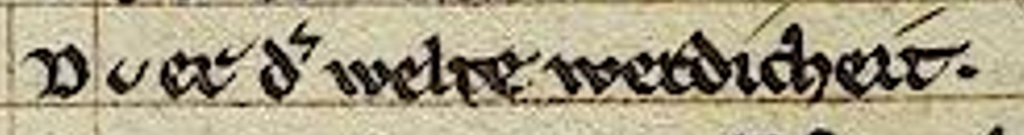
D(az) er d(er) welte werdicheit.
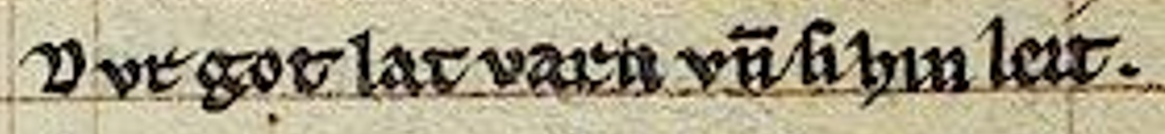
Dvr got lat varn vn(d) ſi hin leit.
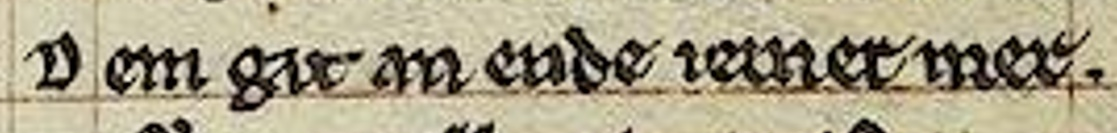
Dem git an ende iemer mer.
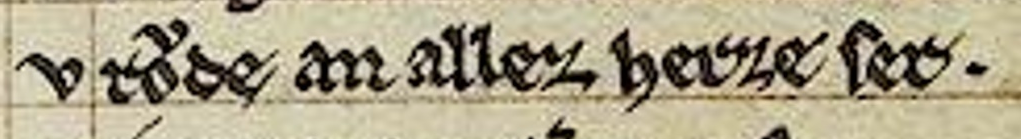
Vro°vde an allez herze ſer.
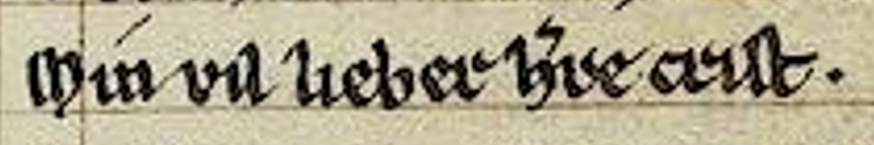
Min vil lieber h(er)re criſt.
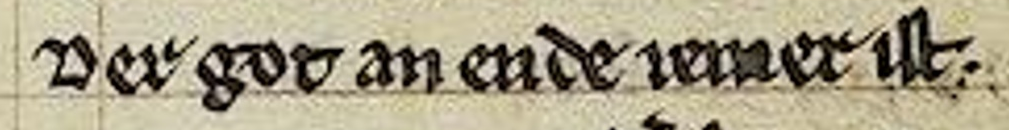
Der got an ende iemer iſt.
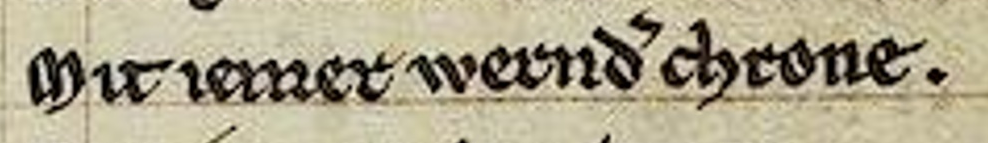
Mit iemer wernd(er) chrone.
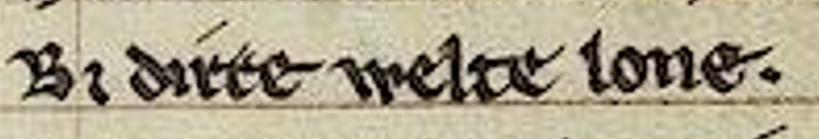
Bi dirre welte lone.
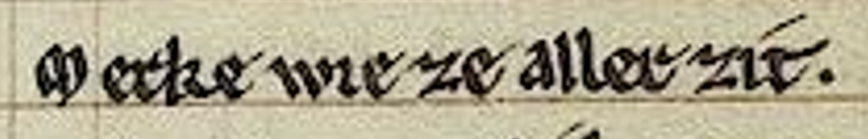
Merke wie ze aller zit.
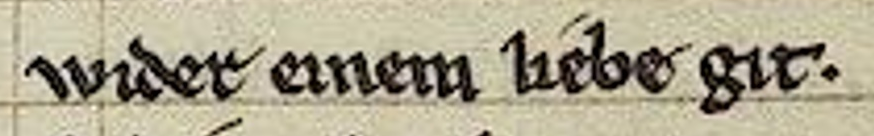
Wider einem liebe git.
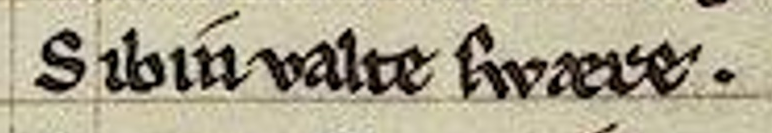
Sibin valte ſw[ae]re.
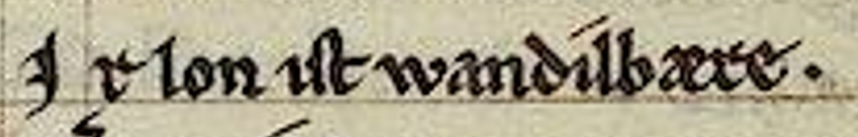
Ir lon iſt wandilb[ae]re.
